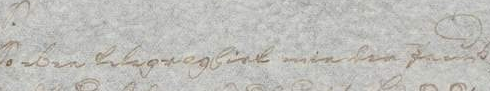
Soeben telegraphirt mir der Preußische
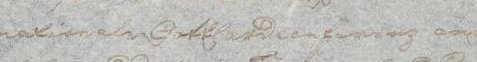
ternationale Gotthardconferenz angenom-
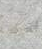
men
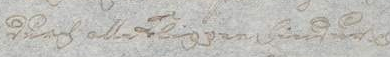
Durch alle Klippen hindurch geht
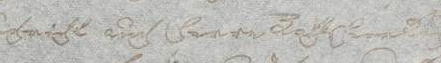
Nachricht auch Herrn Rathsherrn
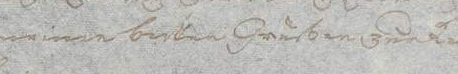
mit meinen besten Grüßen zur Kennt-
